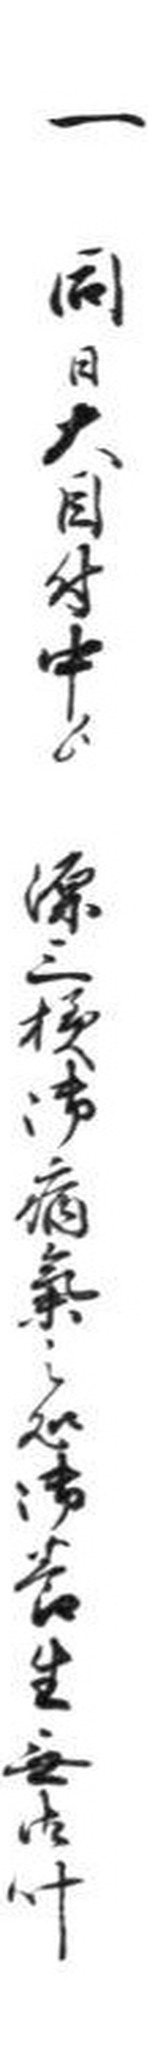一同日大目付中ゟ源三様御病気之処御養生無御叶
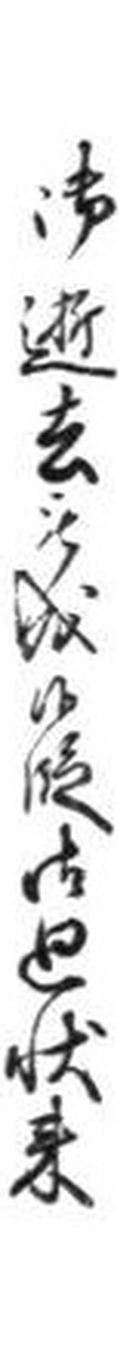御逝去被成候段御廻状来
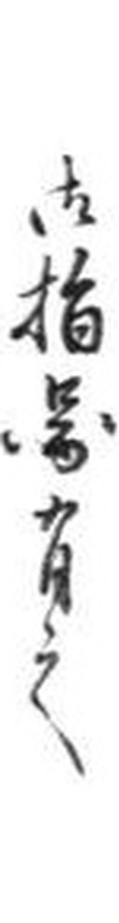御指図有之
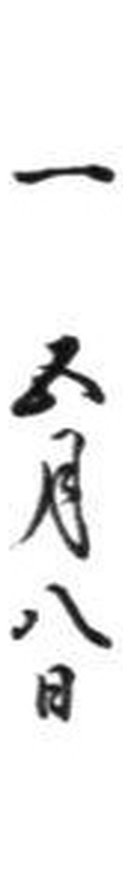一五月八日
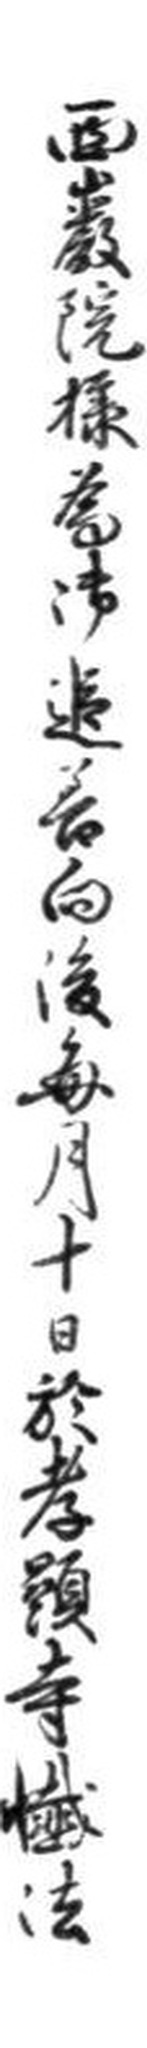西厳院様為御追善向後毎月十日於孝顕寺懺法
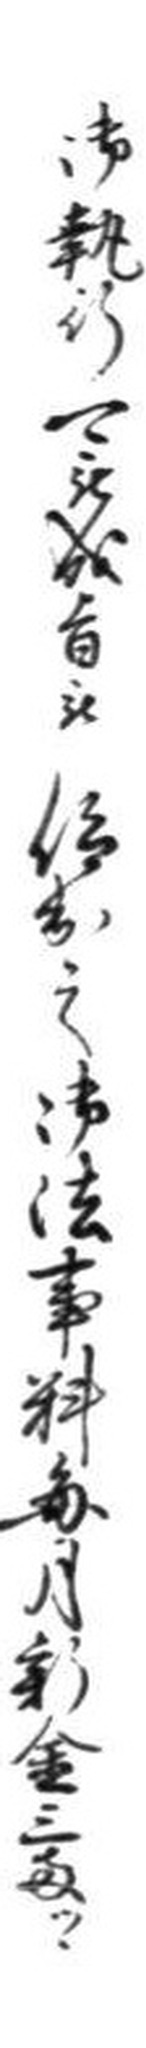御執行可被成旨被仰出之御法事料毎月新金三両ツヽ
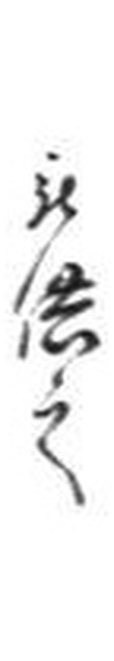被供之
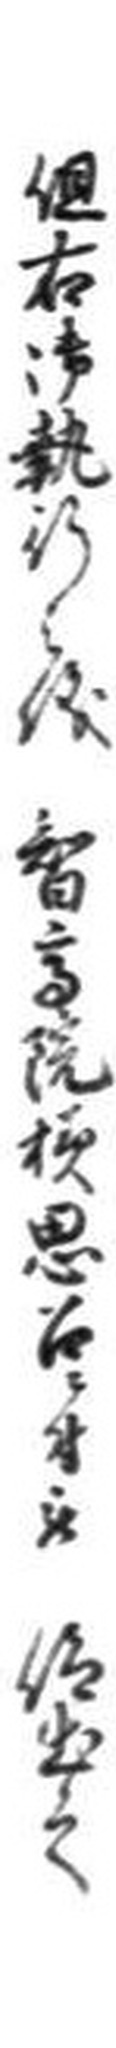但右御執行之儀智高院様思召ニ付被仰出之
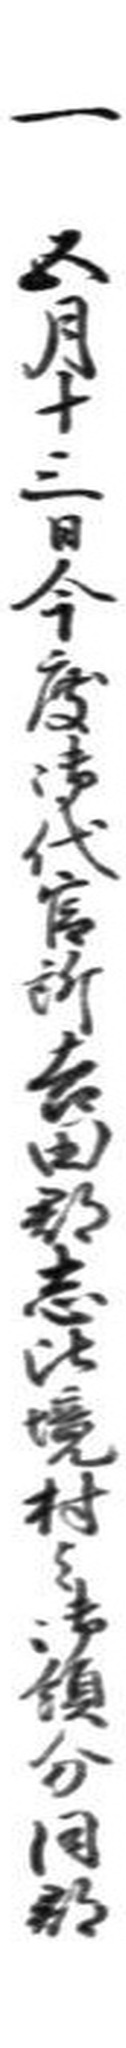一五月十三日今度御代官所吉田郡志比境村与御領分同郡
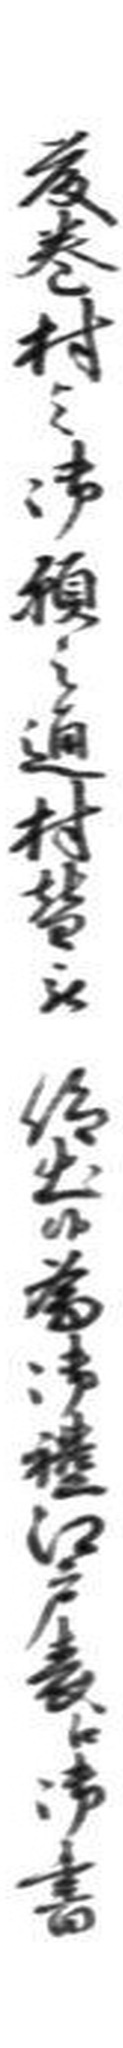藤巻村与御願之通村替被仰出候為御礼江戸表江御書
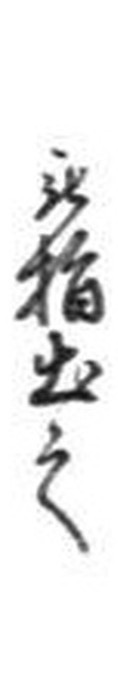被指出之
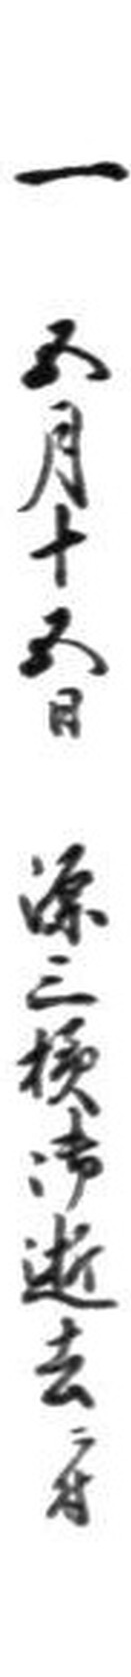一五月十五日源三様御逝去ニ付
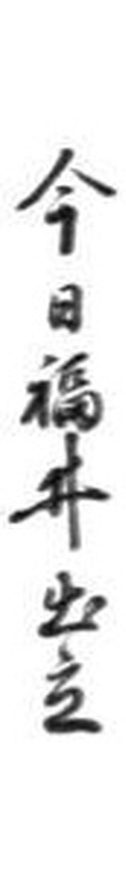今日福井出立

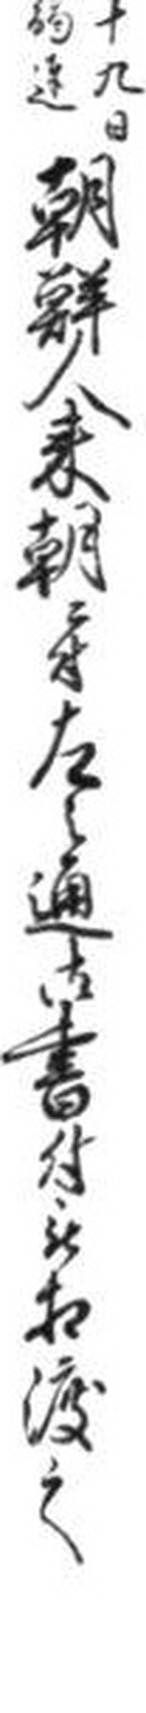御触達朝鮮人来朝ニ付左之通御書付被相渡之
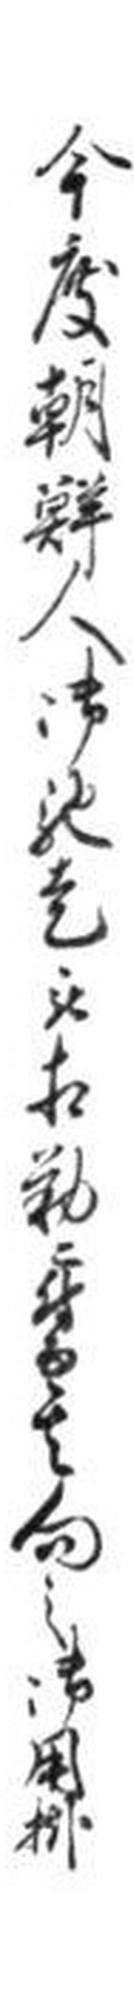今度朝鮮人御馳走被相勤ニ付而其向之御用掛
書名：家譜 三十三 吉邦公 享保四年
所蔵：福井県文書館 Fukui Prefectural Archives
